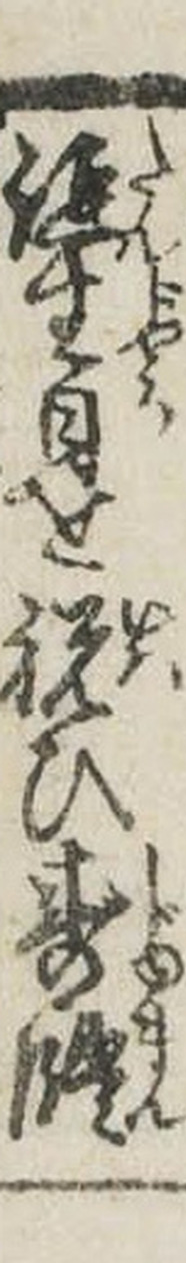誕生日を祝ひ寿饅
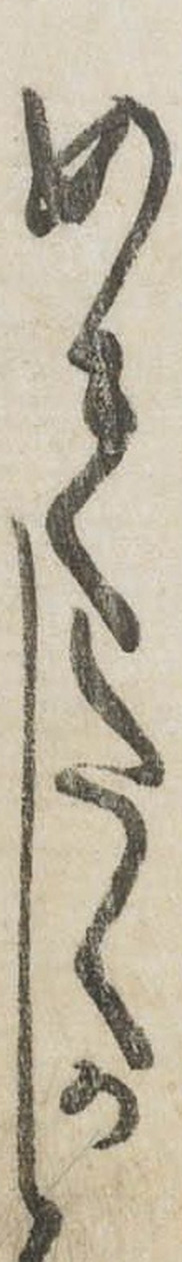めてたくかしく
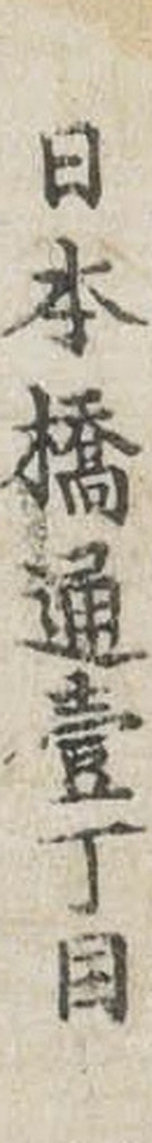日本橋通壱丁目
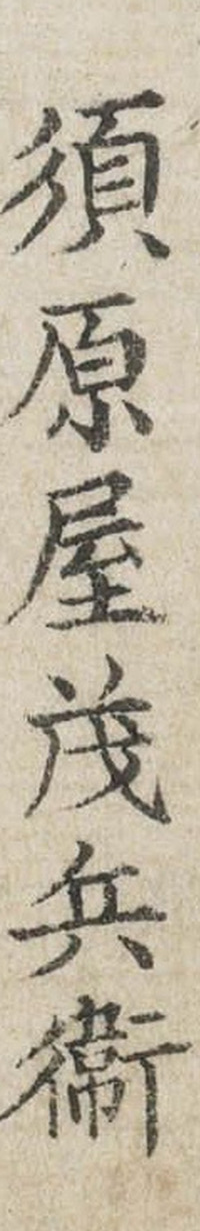須原屋茂兵衛
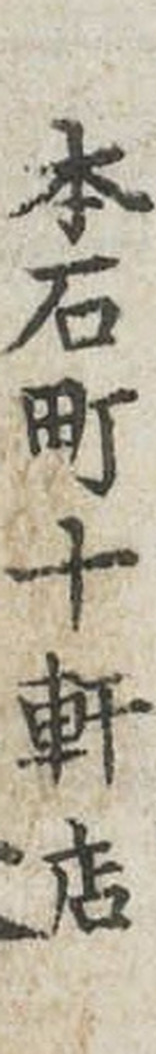本石町十軒店
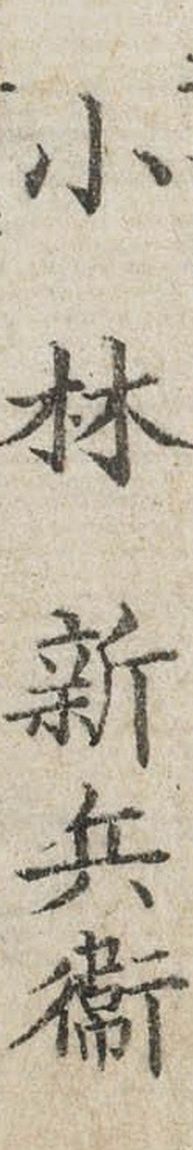小林新兵衛
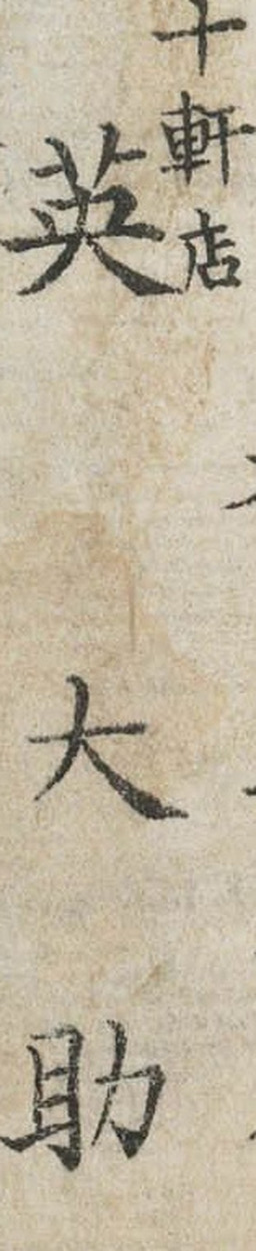英大助
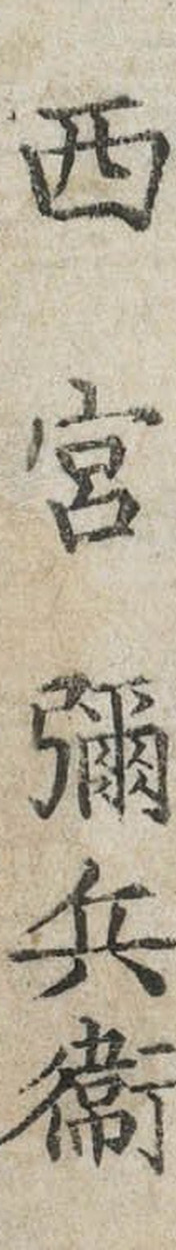西宮弥兵衛
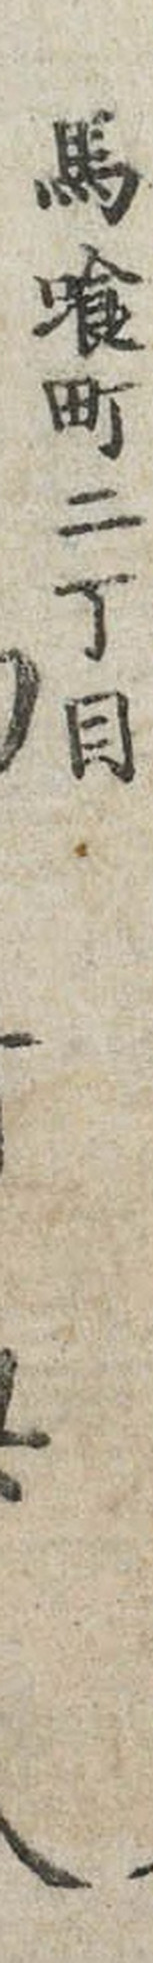馬喰町二丁目
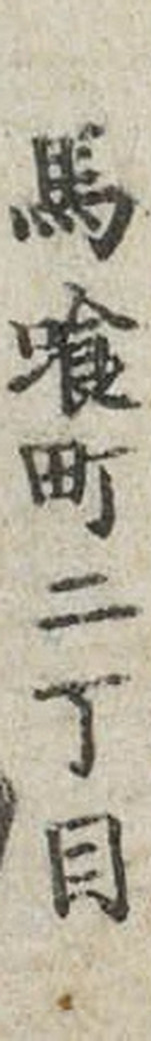馬喰町二丁目
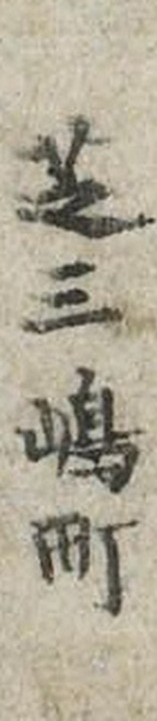芝三嶋町
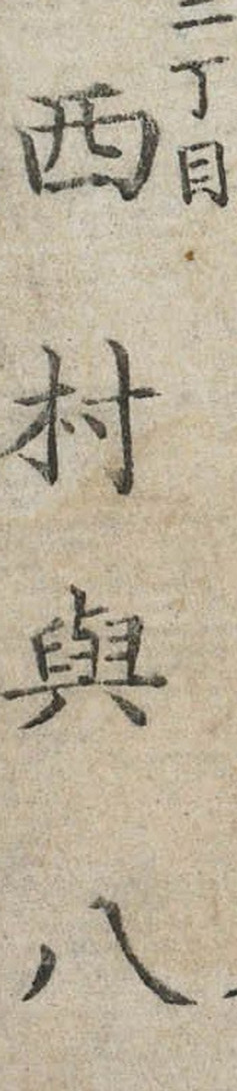西村与八
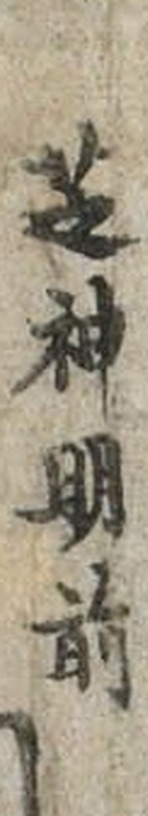芝神明前
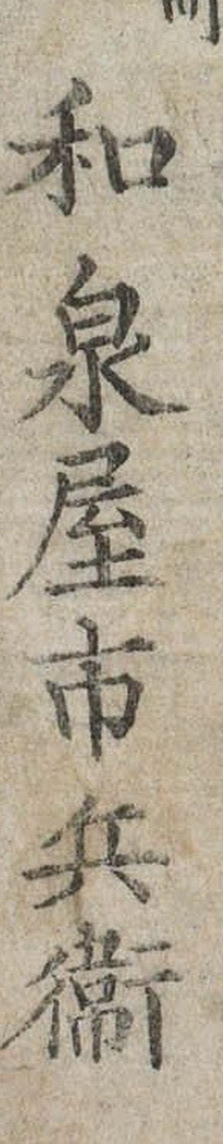和泉屋市兵衛
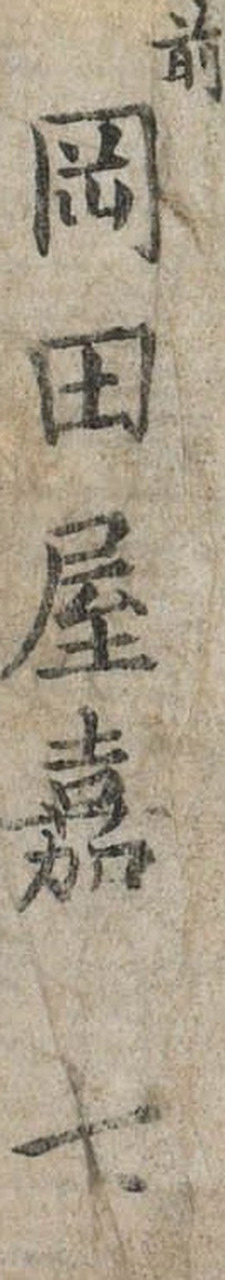岡田屋嘉七
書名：頭書萬用婦人手紙之文言
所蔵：東京学芸大学教育コンテンツアーカイブ
